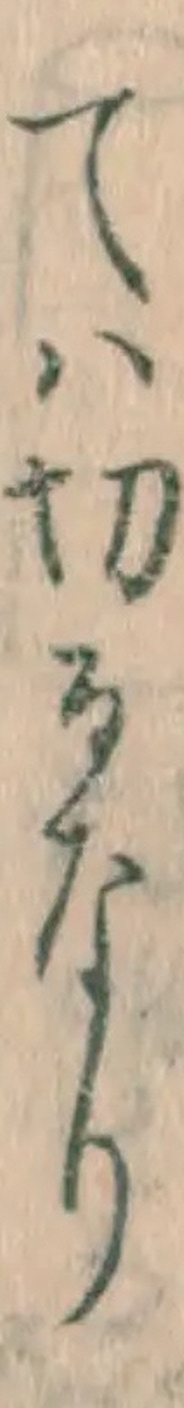ては切るなり
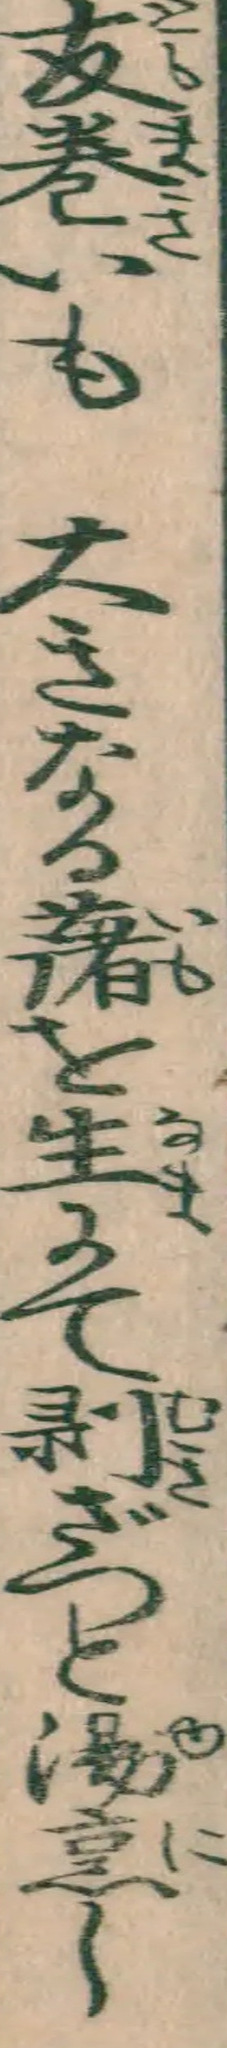[十]友巻いも大きなる藷を生にて剥ざつと湯烹し
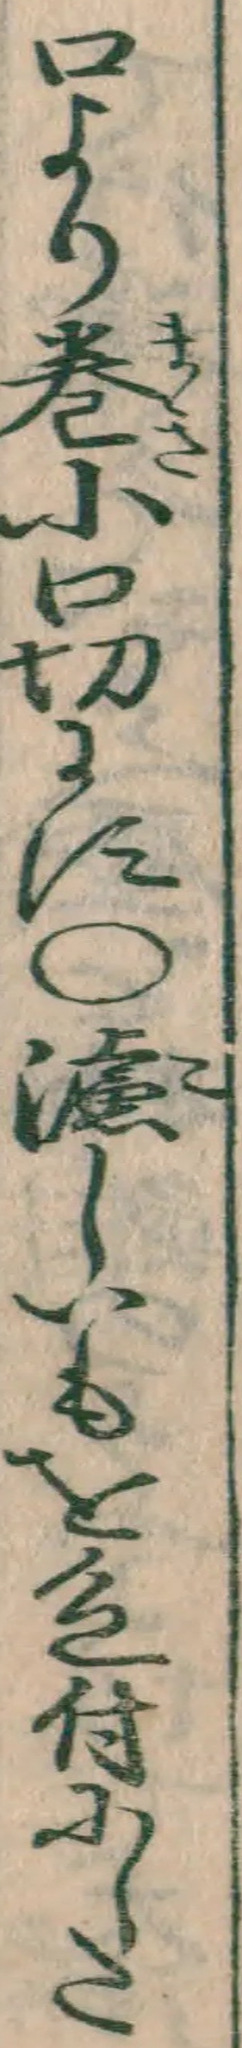口より巻小口切にす○濾しいもを色付にした
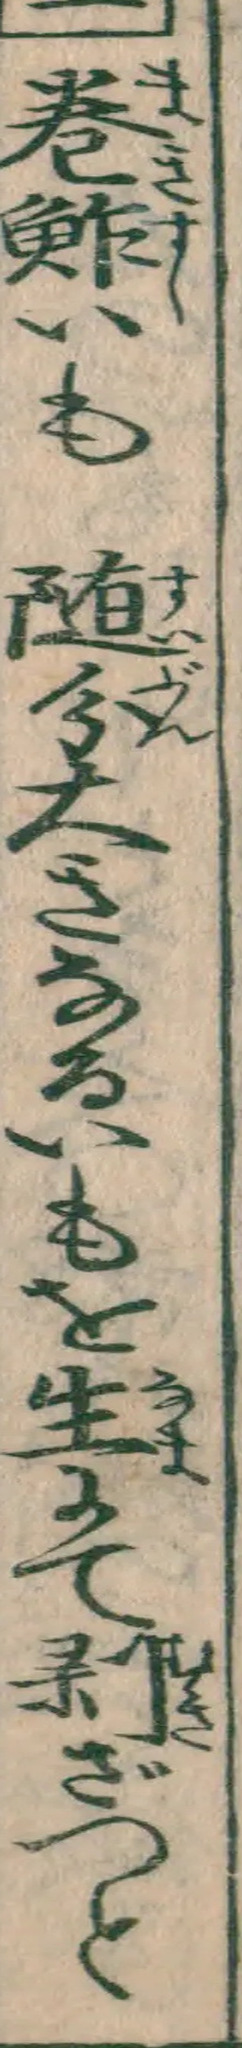[十一]巻鮓いも随分大きなるいもを生にて剥ざつと
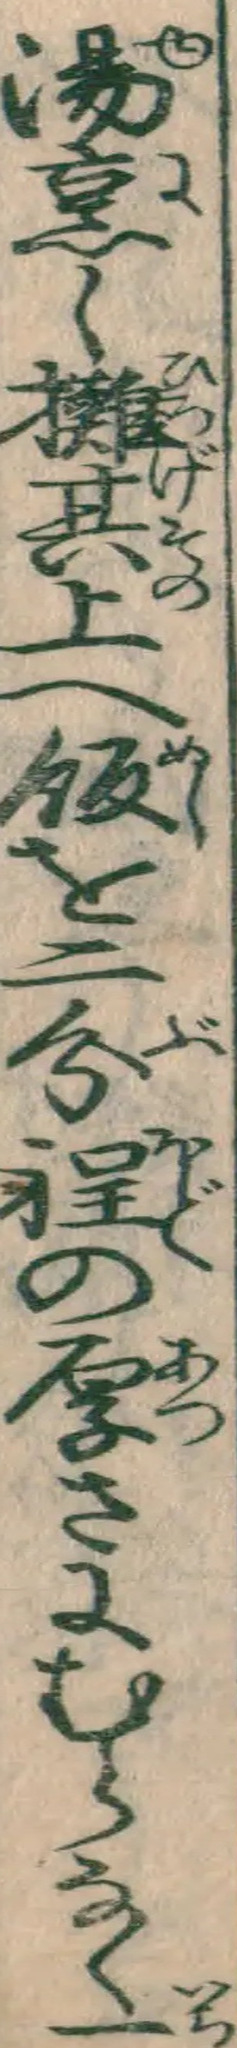湯烹し攤其上へ飯を二分程の厚さにむらなく一
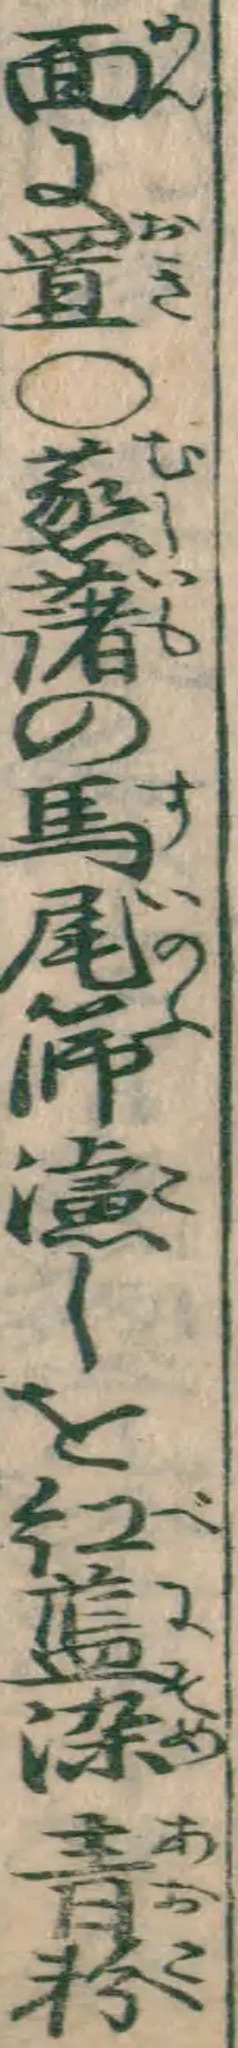面に置○蒸藷の馬尾篩濾しを紅藍染青粉
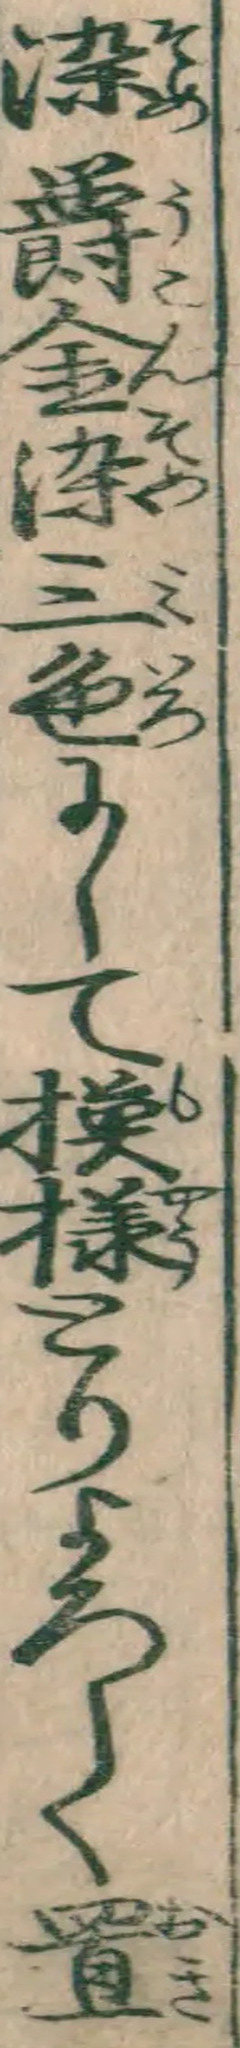染爵金染三色にして摸様とりよろしく置
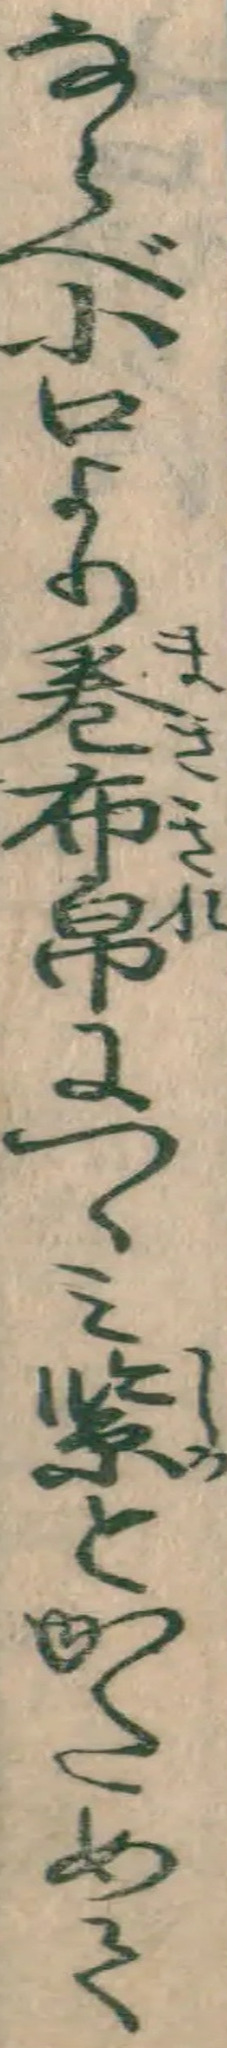ならべ小口より巻布帛につゝみ緊とかためて

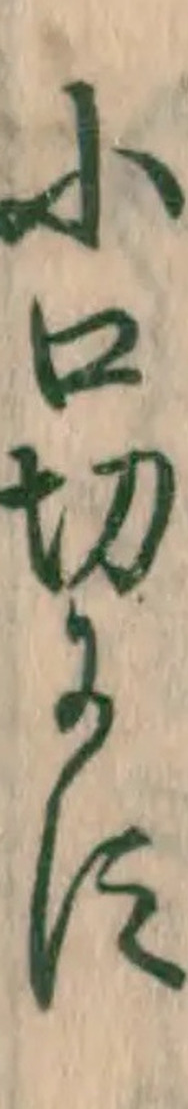小口切にす
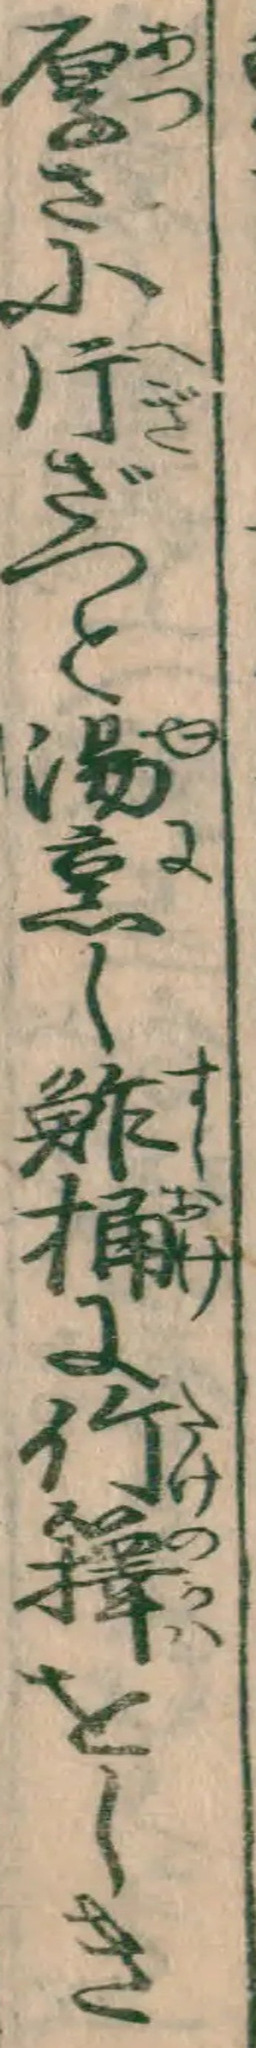厚さに片ざつと湯烹し鮓桶に竹籜をしき
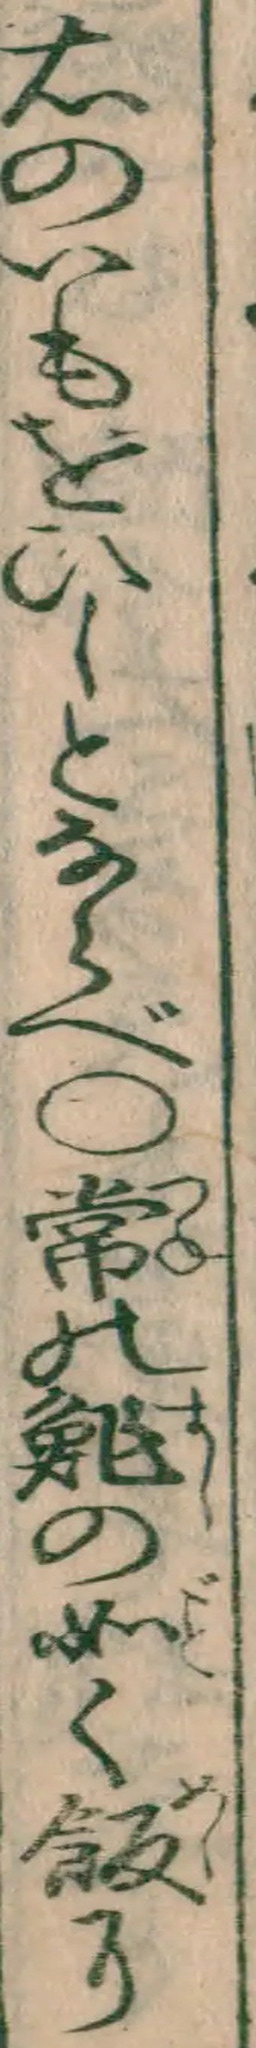右のいもをひしとならべ○常の鮓の如く飯に
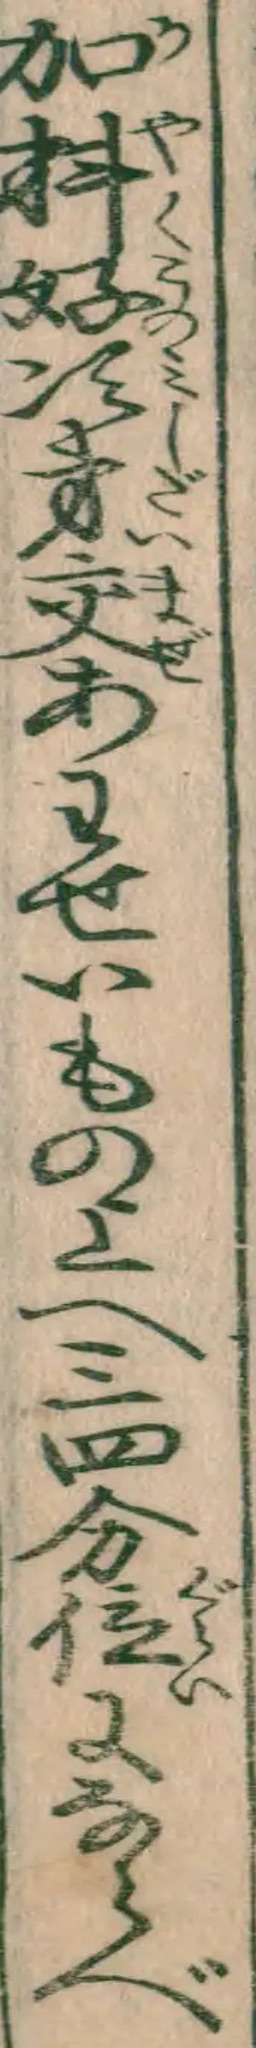加料好次第交あわせいもの上へ三四分位にならべ
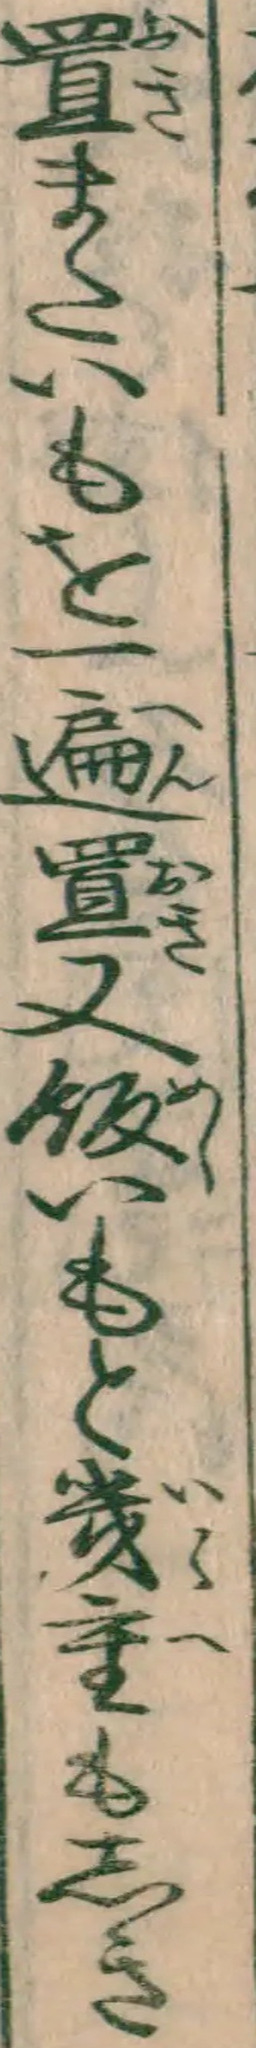置またいもを一遍置又飯いもと幾重もしき
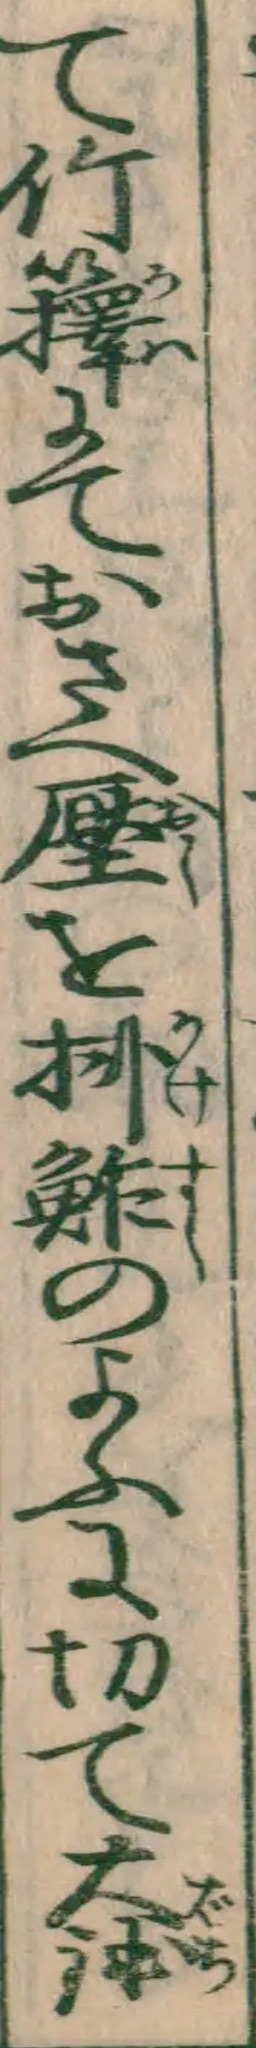て竹籜にておさへ圧を掛鮓のよふに切て大鉢
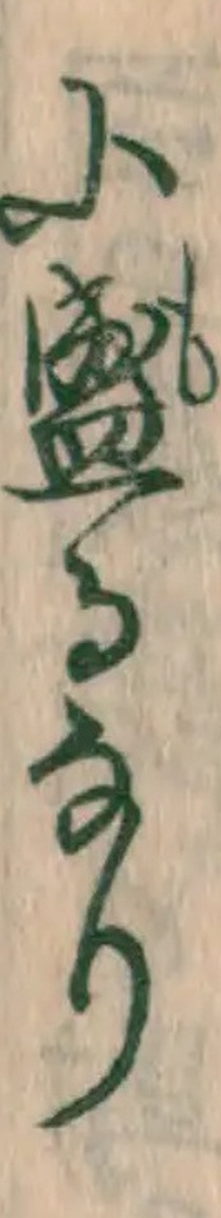に盛るなり
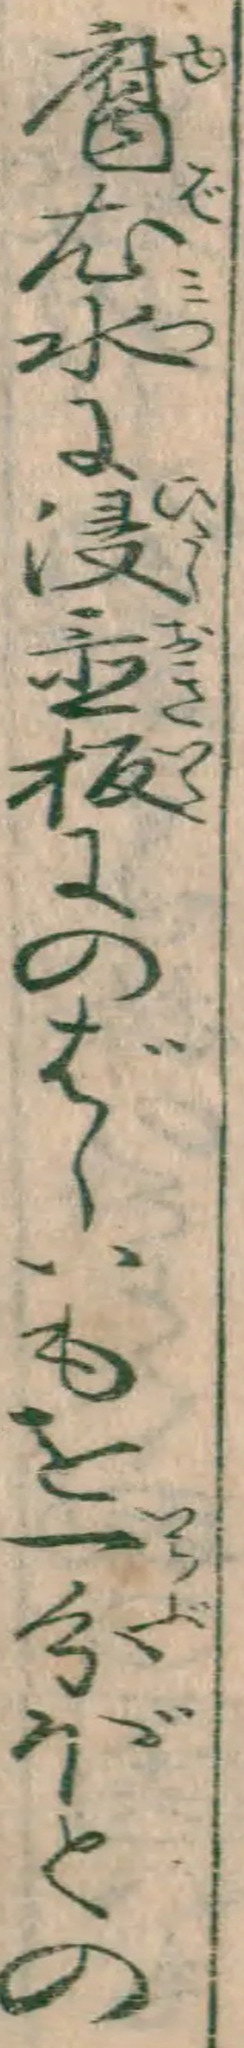腐衣水に浸置板にのばしいもを一分ぼとの
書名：甘藷百珍
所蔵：国立国会図書館 National Diet Library, JAPAN
